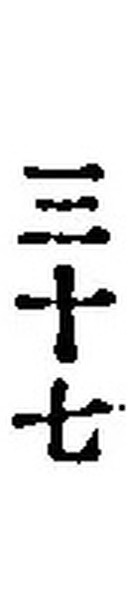三十七

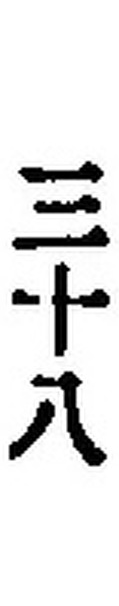三十八
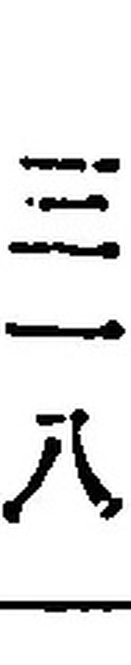三十八
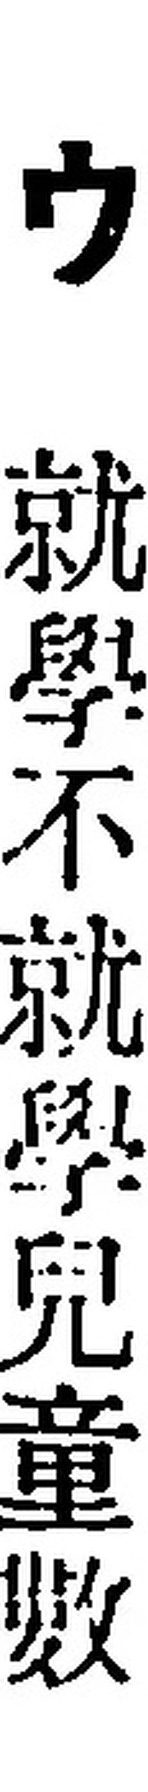ウ就學不就學兒童數
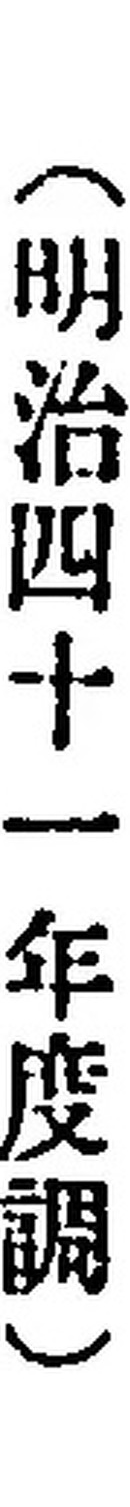(明治四十一年度調)
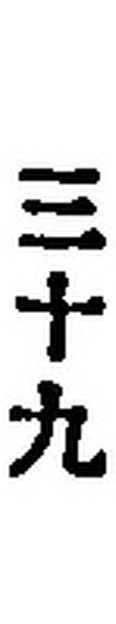三十九

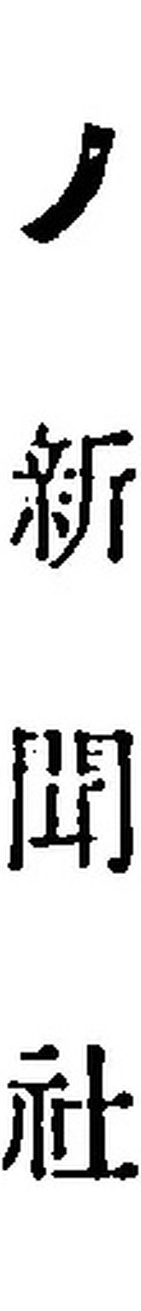ノ新聞社
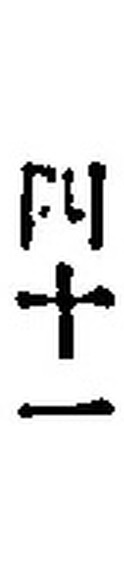四十一

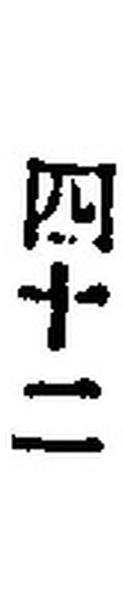四十二
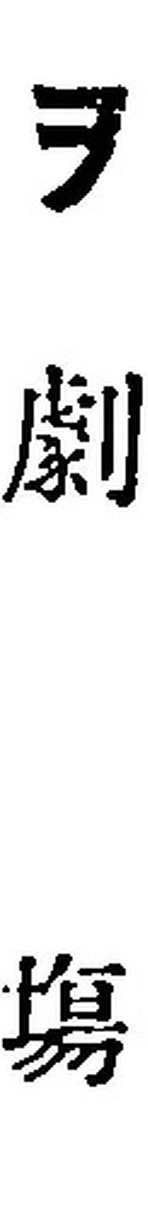ヲ劇場
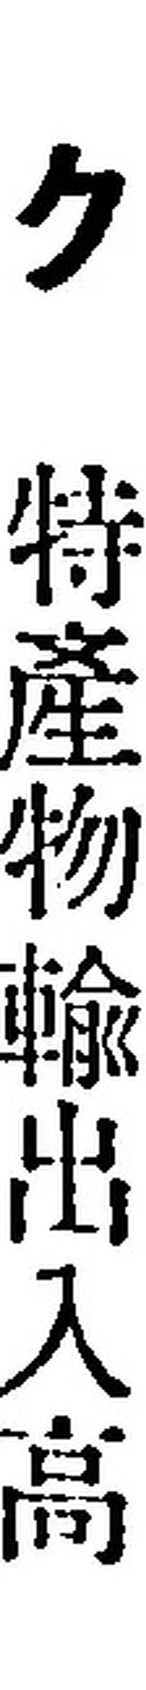ク特產物輸出入高
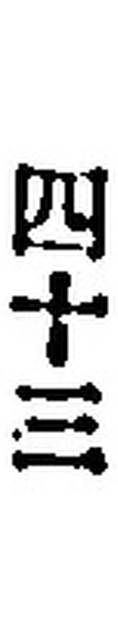四十三

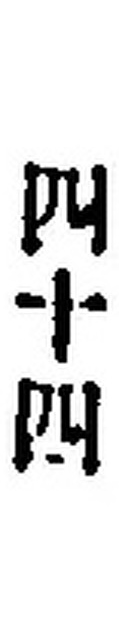四十四
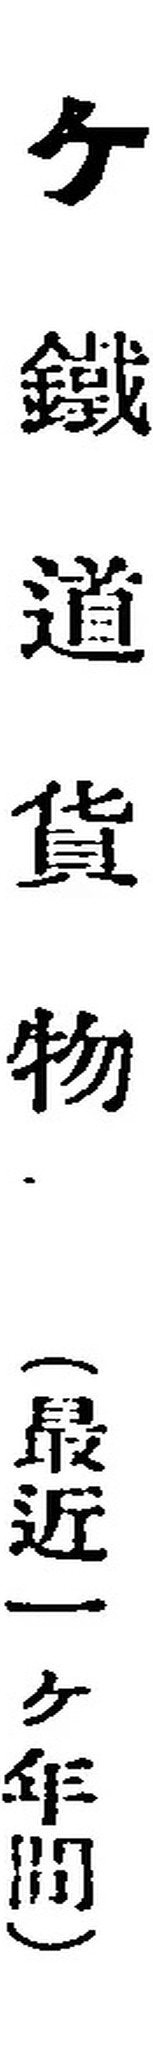ケ鐵道貨物(最近一ヶ月間)
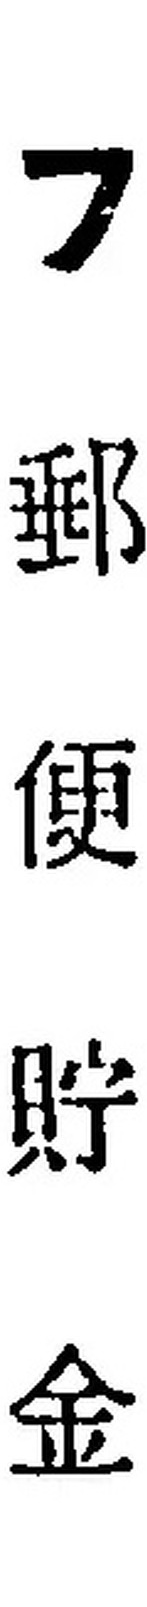フ郵便貯金
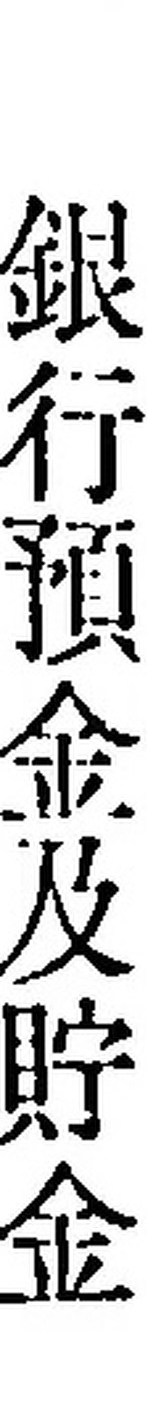コ銀行預金及貯金
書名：豊橋志要
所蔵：国立国会図書館 National Diet Library, JAPAN
